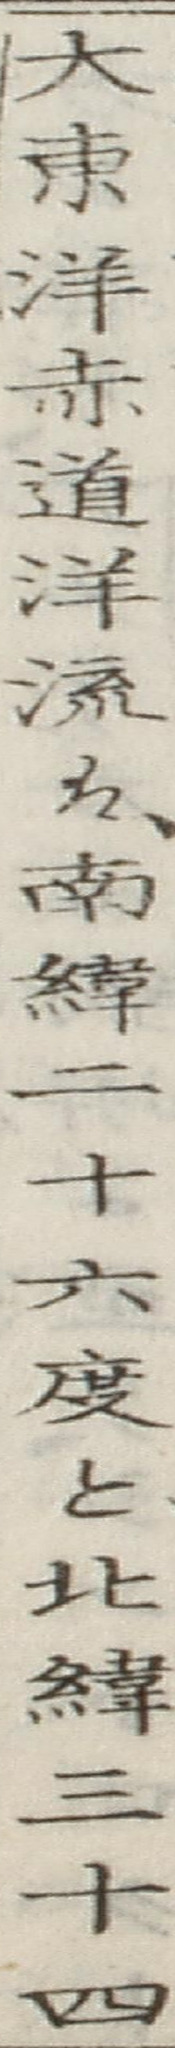大東洋赤道洋流は、南緯二十六度と、北緯三十四
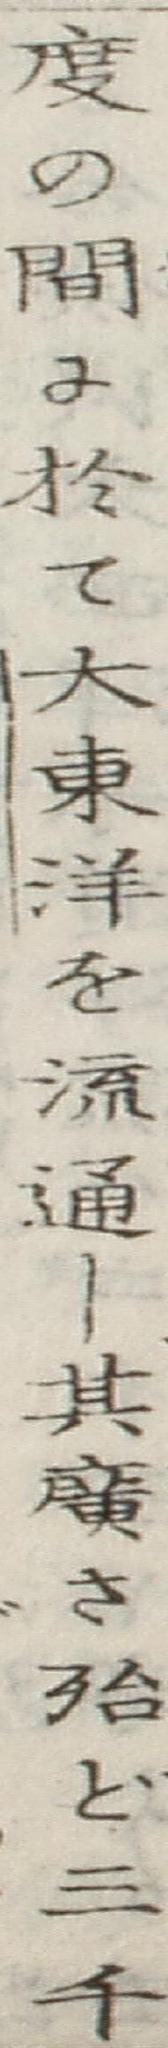度の間に於て、大東洋を流通し、其広さ殆ど三千
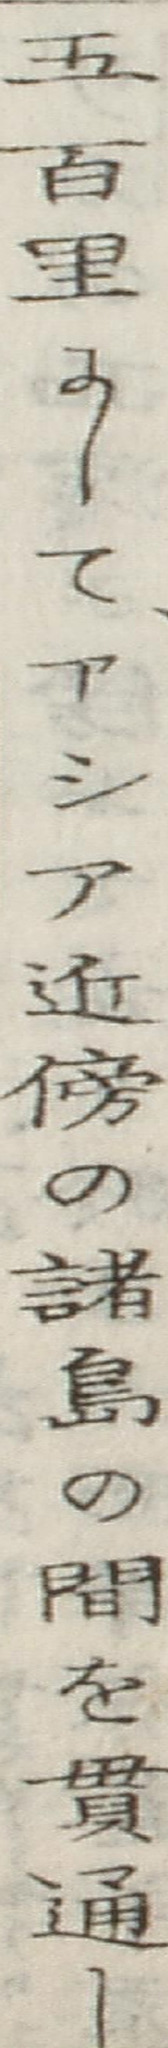五百里にして、アシア近傍の諸島の間を貫通し
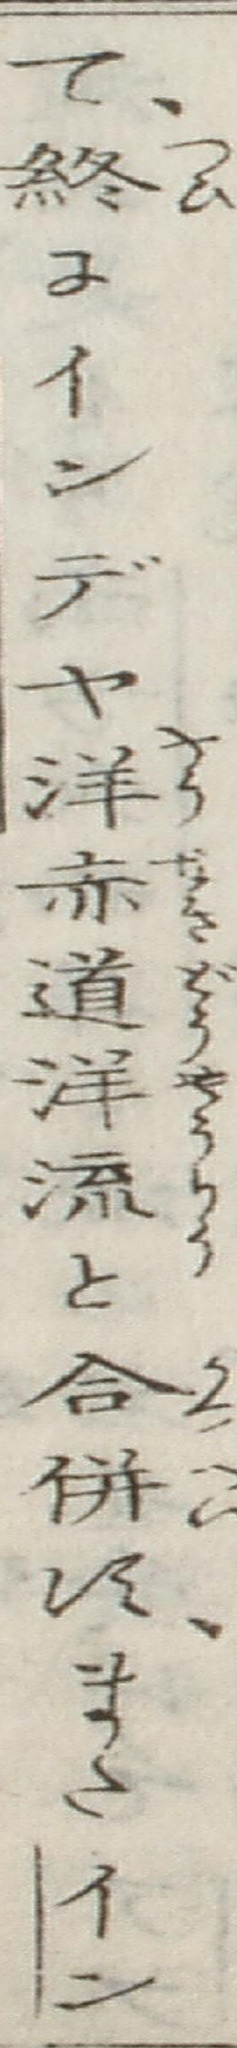て、終にインデヤ洋赤道洋流と合併す、またイン
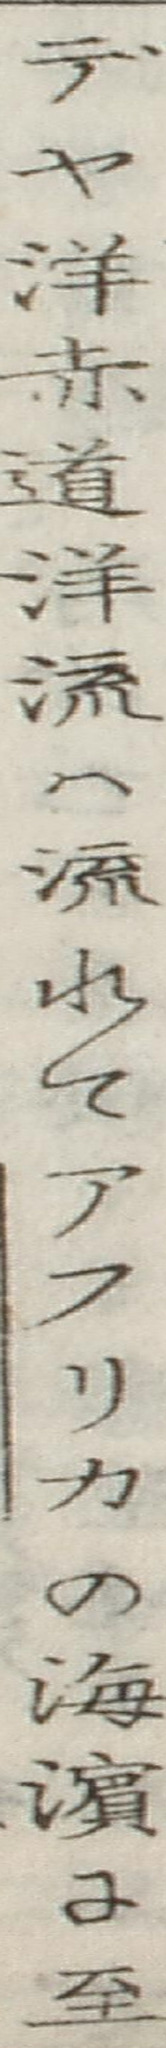デヤ洋赤道洋流は、流れてアフリカの海浜に至
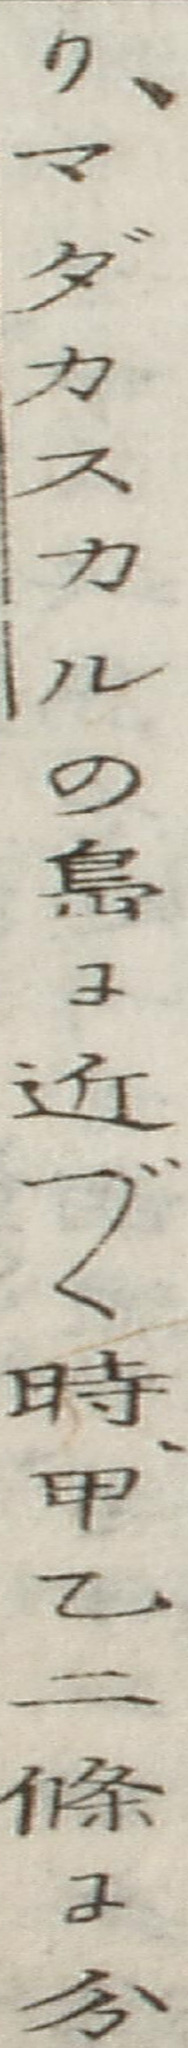り、マダカスカルの島に近づく時、甲乙二条に分

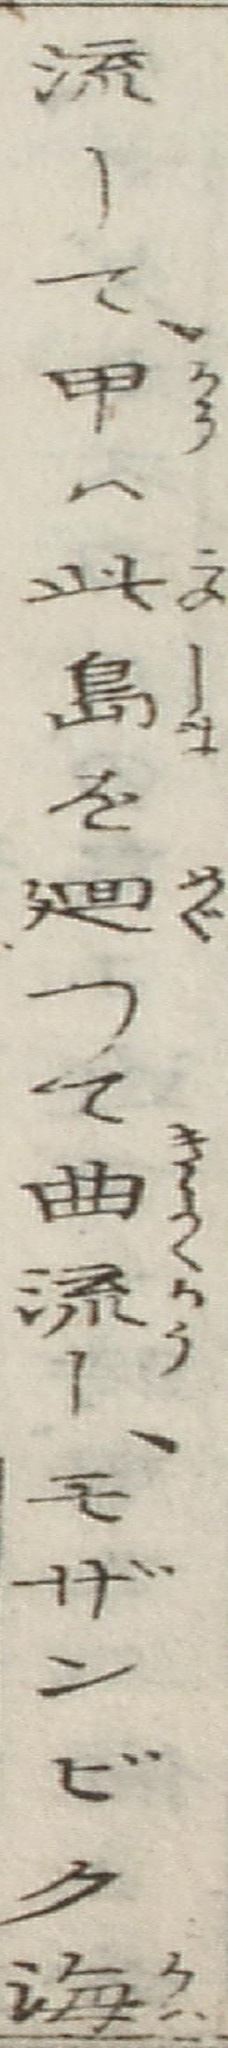流して、甲は此島を廻つて、曲流し、モザンビク海
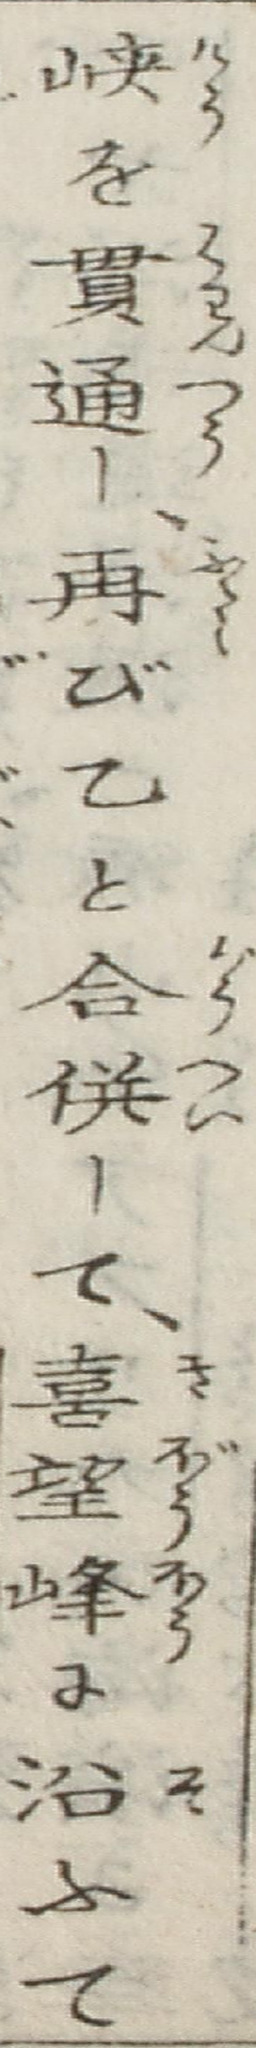峡を貫通し、再び乙と合併して、喜望峰に沿ふて
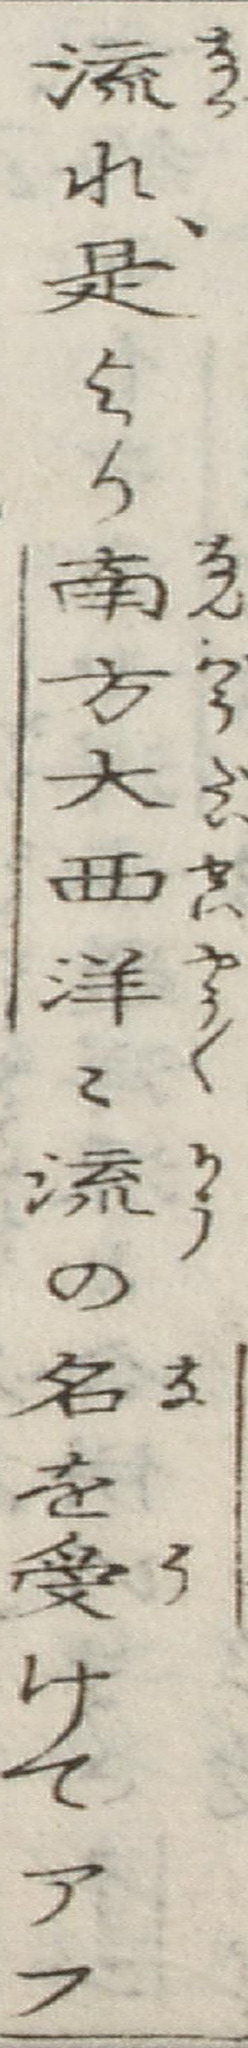流れ、是より南方大西洋〻流の名を受けてアフ
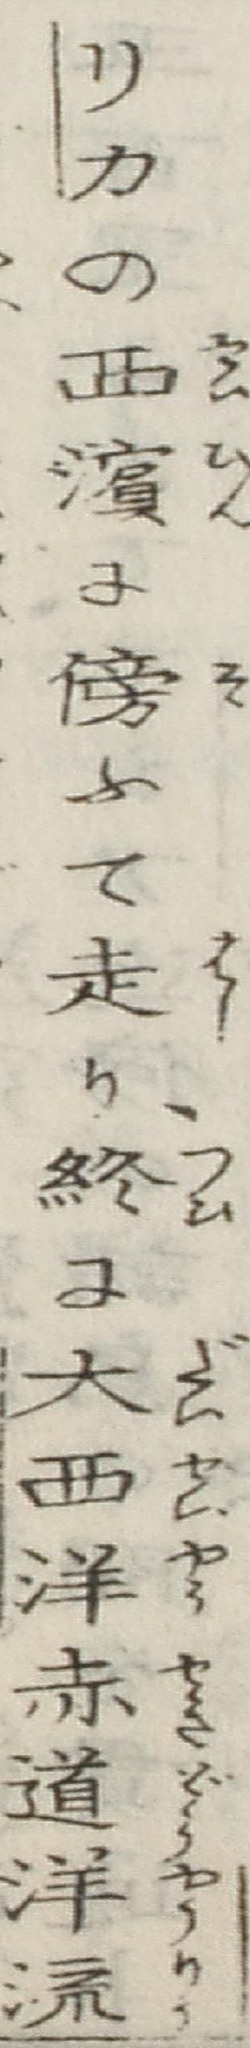リカの西浜に傍ふて走り、終に大西洋赤道洋流
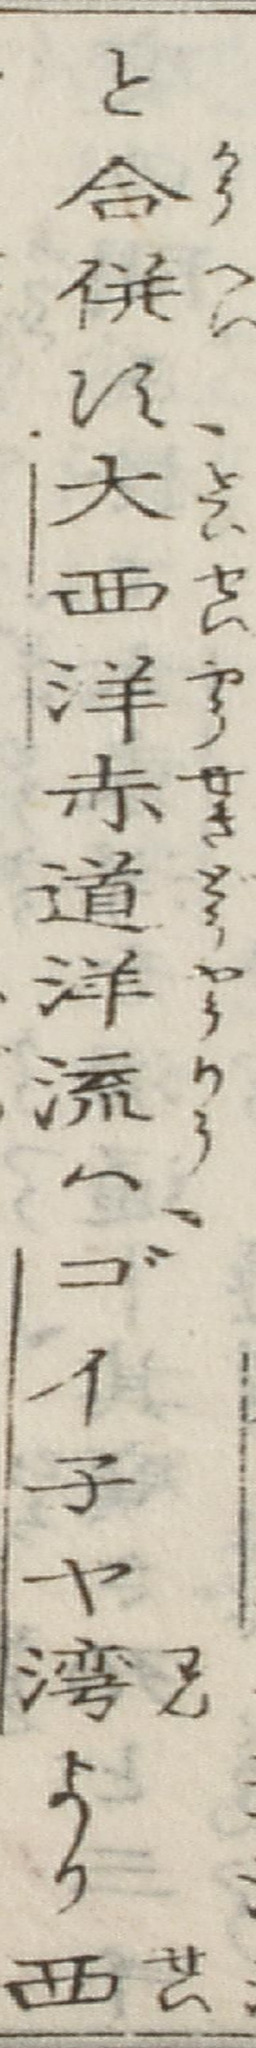と合併す、大西洋赤道洋流は、ゴイ子ヤ湾より西
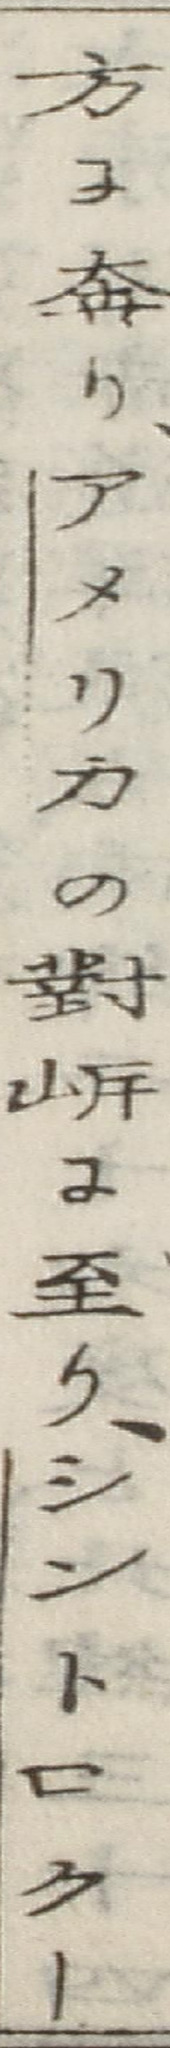方に奔り、アメリカの対岸に至り、シントロクー
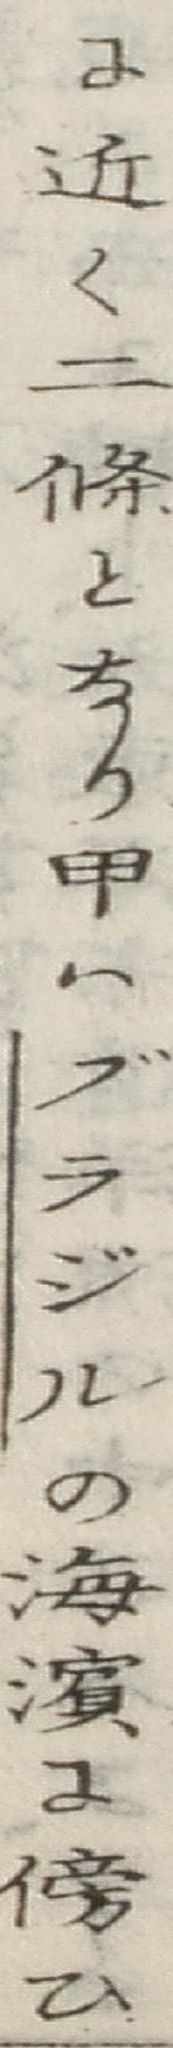に近く二条となり、甲はブラジルの海浜に傍ひ
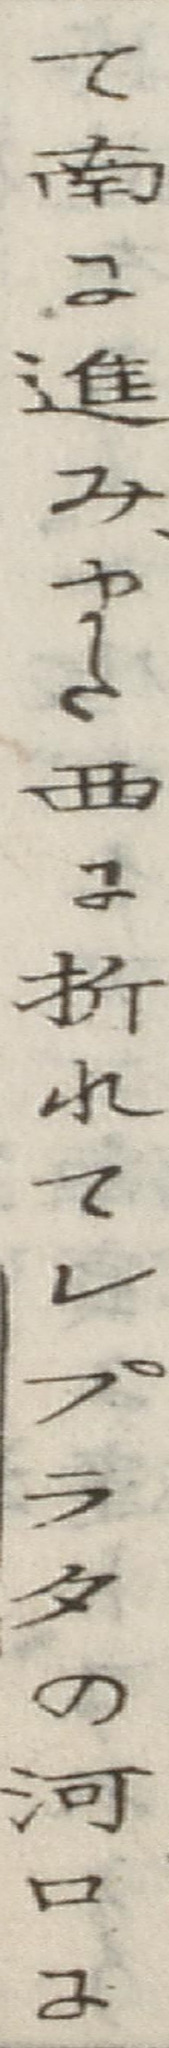て南に進み、また西に折れてレプラタの河口に
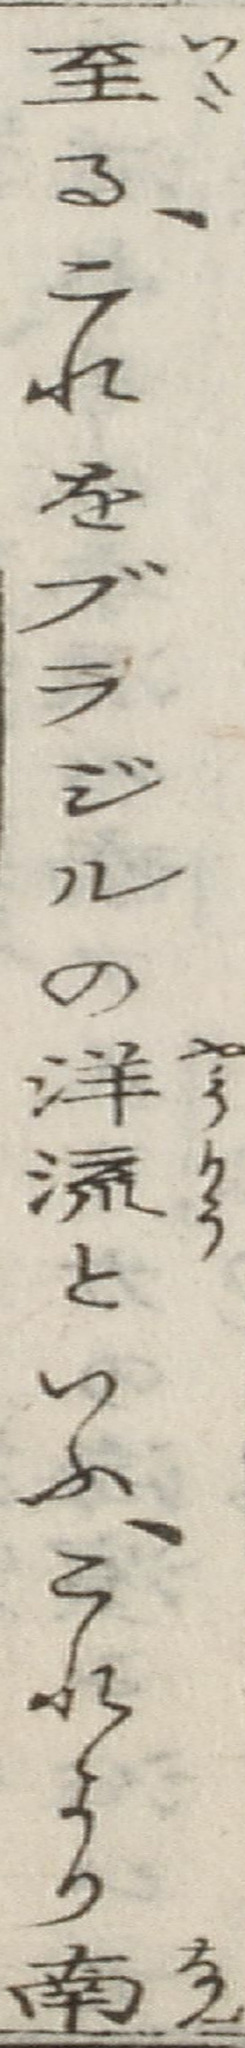至る、これをブラジルの洋流といふ、これより南
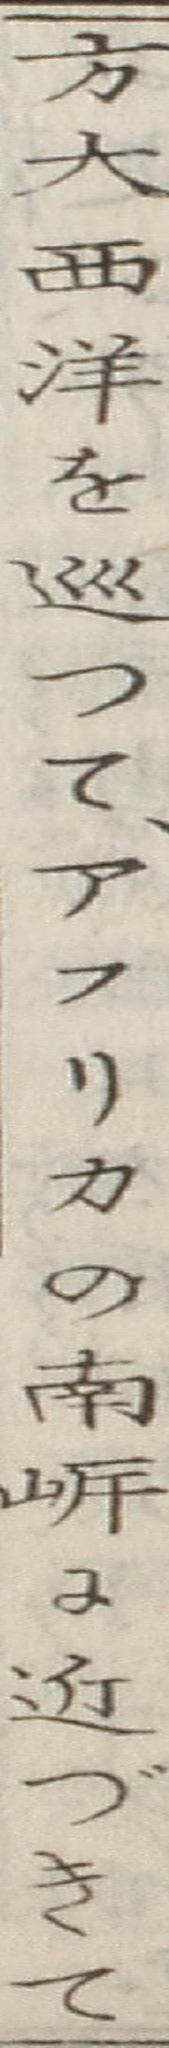方大西洋を巡つて、アフリカの南岸に近づきて、
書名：訓蒙　天然地理學　中
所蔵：東京大学地震研究所図書室 Earthquake Research Institute Library, The University of Tokyo, JAPAN
